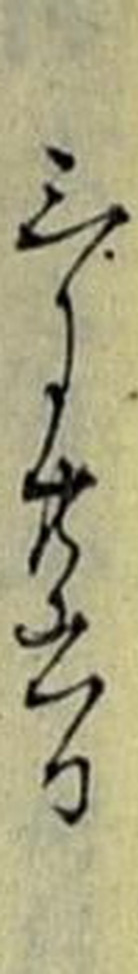三月廿六日
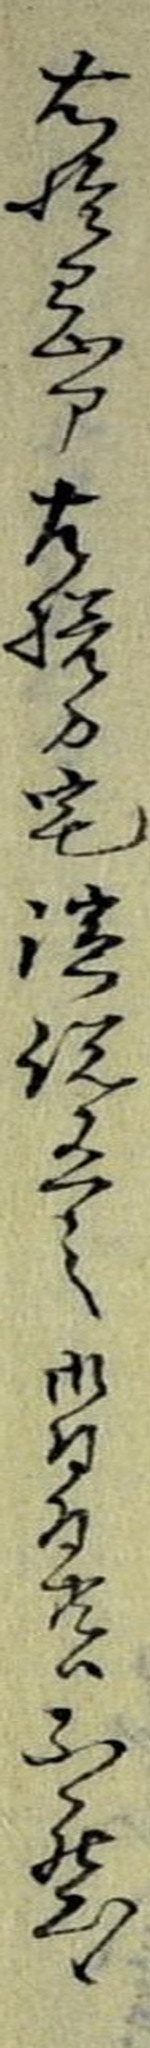右於岡部左膳方宅演説有之御目付共は不罷出候
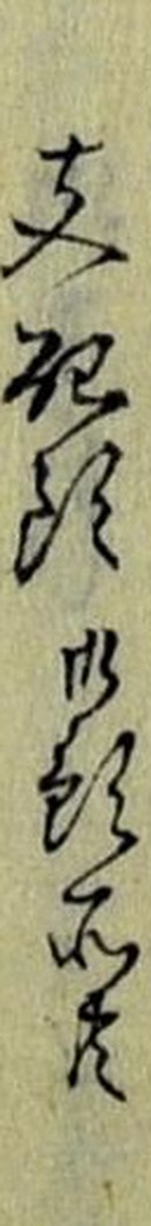支配頭御預所共
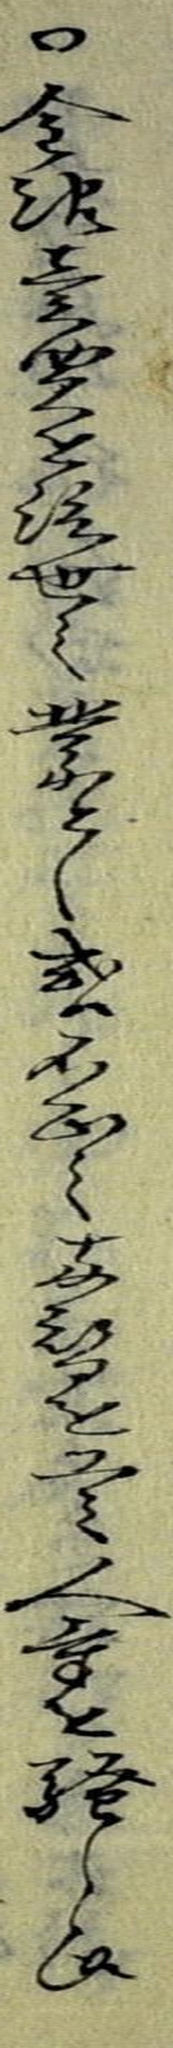○金銀売買を渡世之業とし或は不正之両替を工ミ人気を騒し候趣
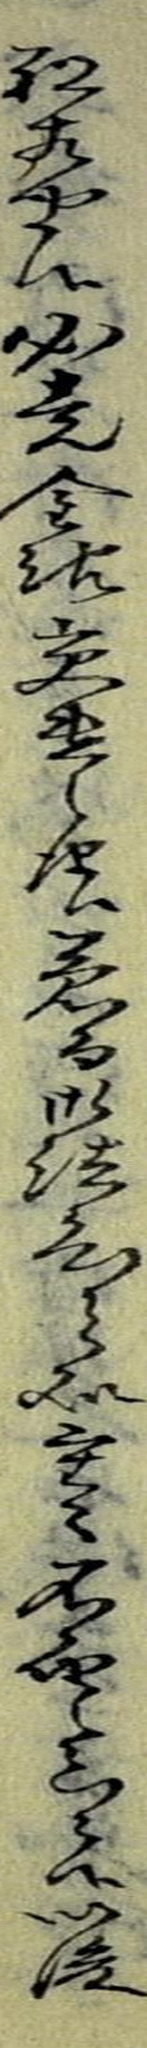粗相聞候必竟金銀交遣之儀は兼而御法度に候処重々不届之至に候以後
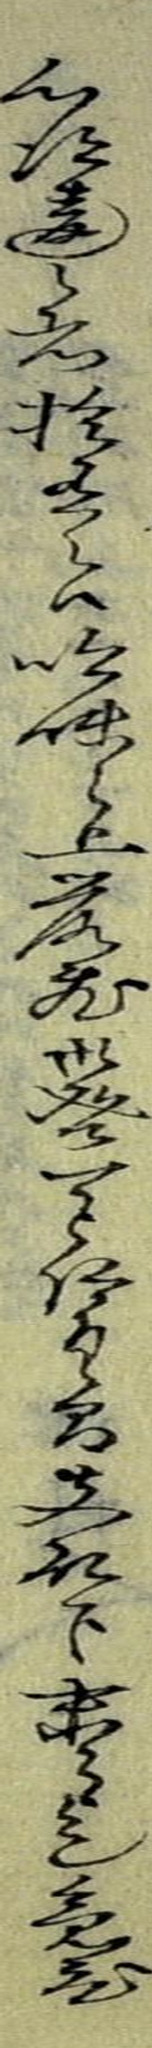心得違之者於有之は吟味之上厳敷御咎可被仰付候間支配下末々迄急度
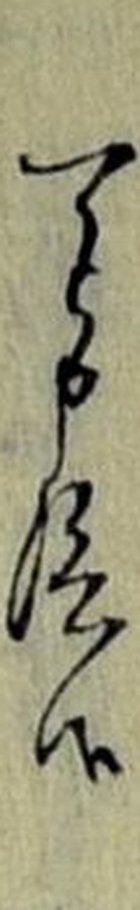可被申渡候
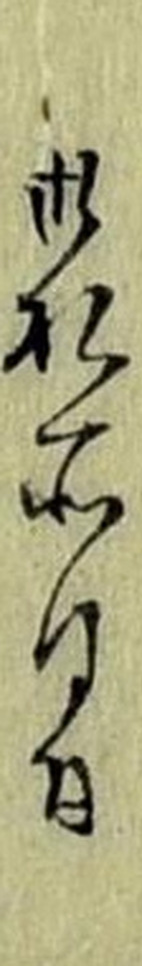御札所目付
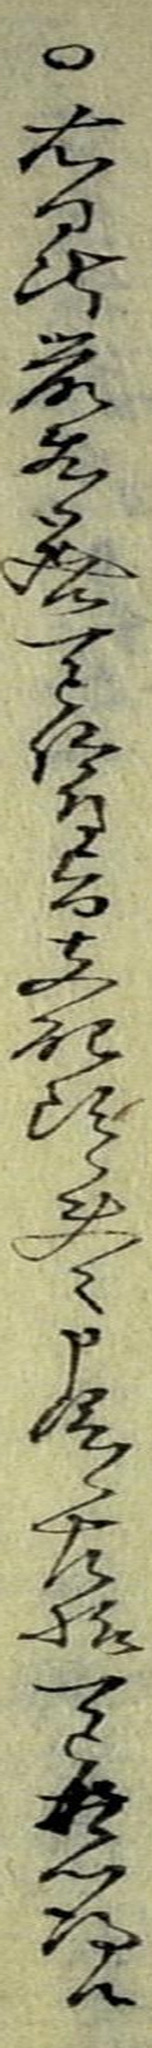○右同断厳敷御咎可被仰付候旨支配頭夫々申渡候左様可被相心得候
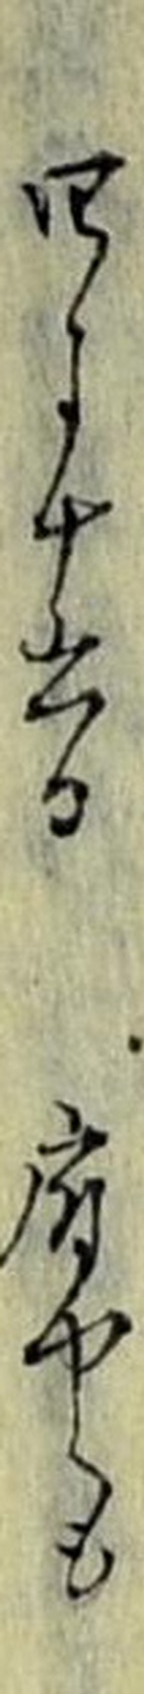四月十六日府中へも
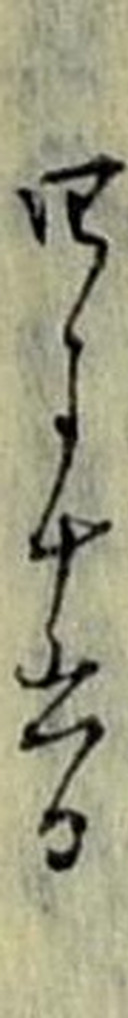三月十一日
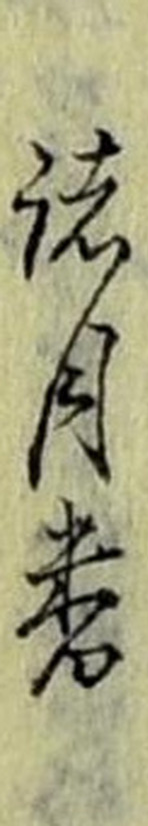諸月番
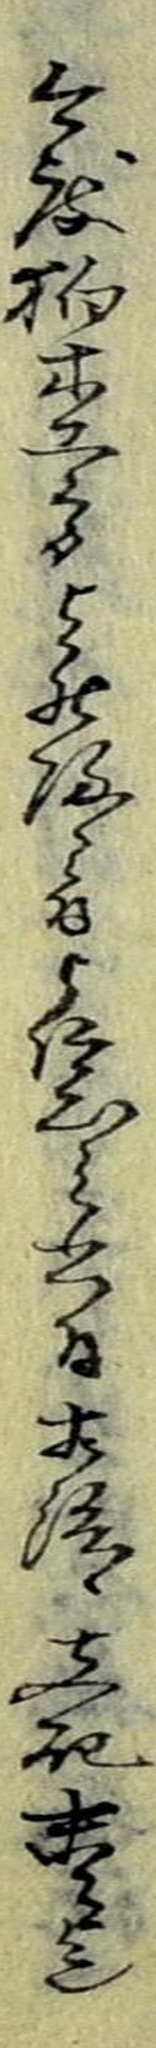今度狛木工方被罷帰候に付被仰出候書付相渡候支配末々迄
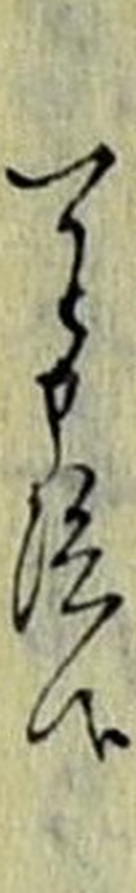可被申渡候
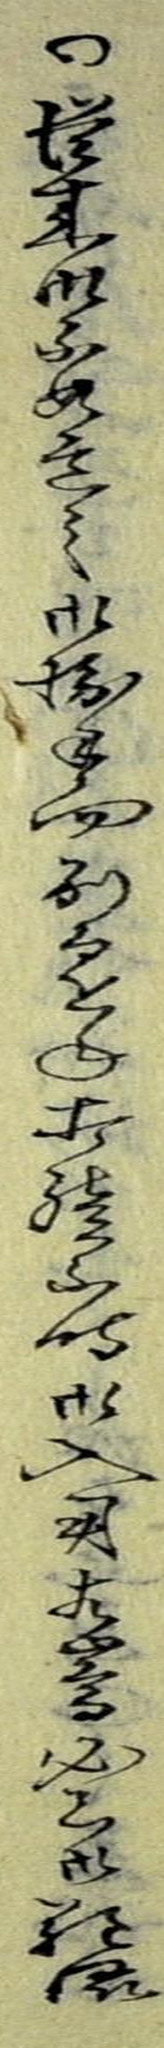○従來御不如意之御勝手向別而近年打続不時御入用相嵩必至御難渋

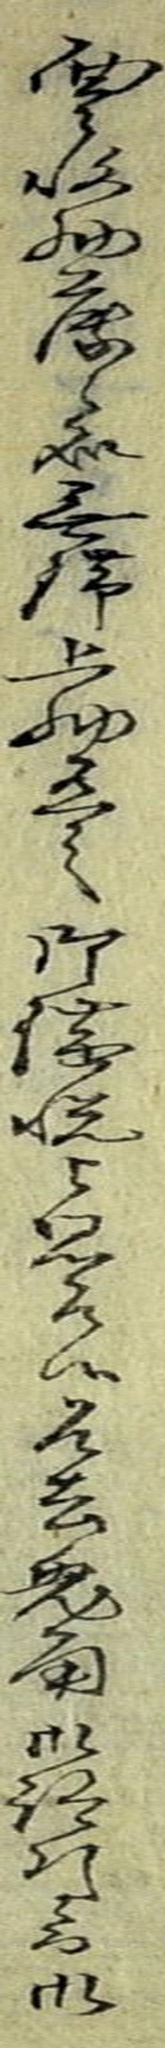面々収納薄候処無滞上納有之御満悦被思召候乍去兎角御跡引に而御
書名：命令之部 六
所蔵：福井県文書館 Fukui Prefectural Archives
